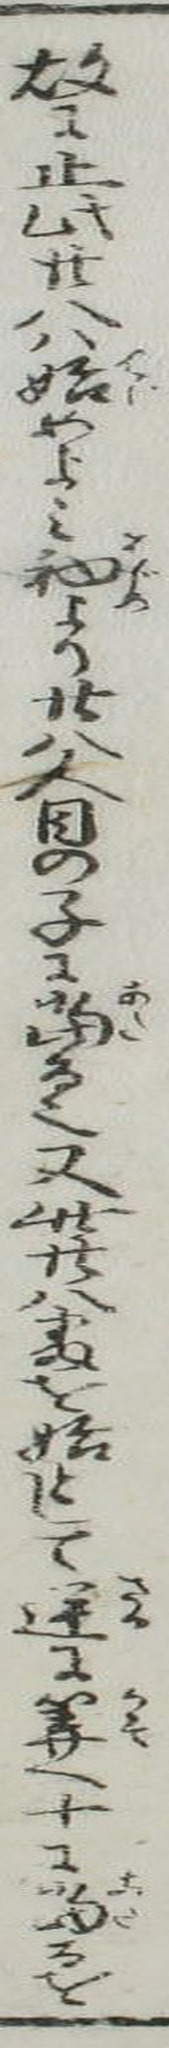故に止此廿八は始めよみ初より廿八人目の子に当る也又此この廿八番を始として逆に算へ十に当るを
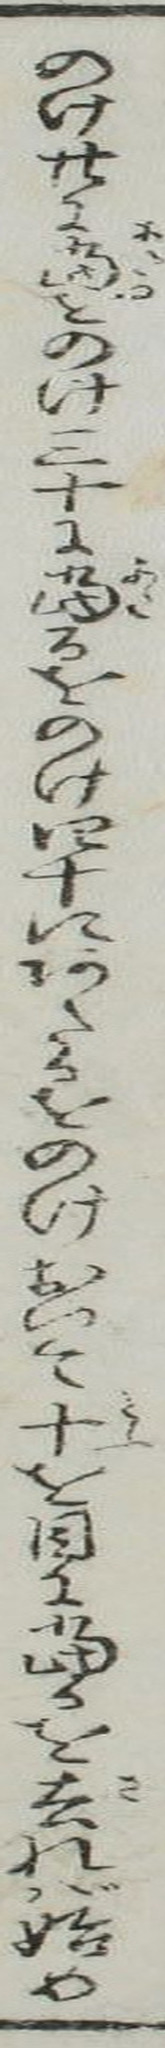のけ廿に当をのけ三十に当るをのけ四十にあたるをのけおいて十を目に当るを去れば始め
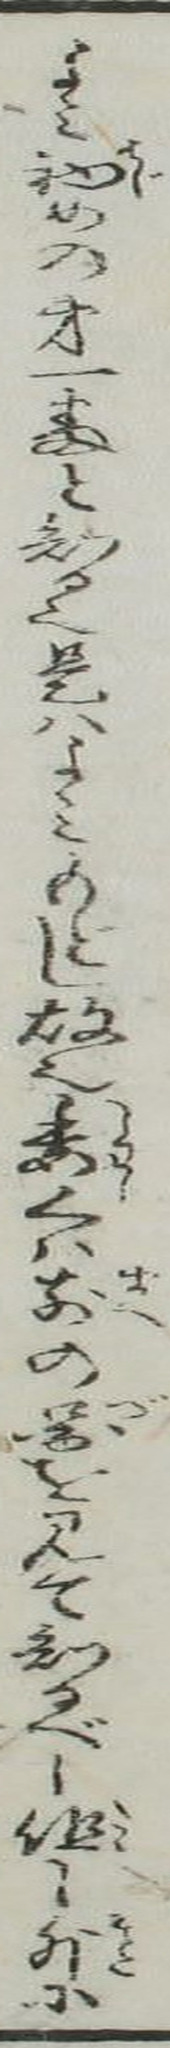よみ初めの第一番と知る也是はよみもどし故也委くは前の図を見て知るべし但し外に

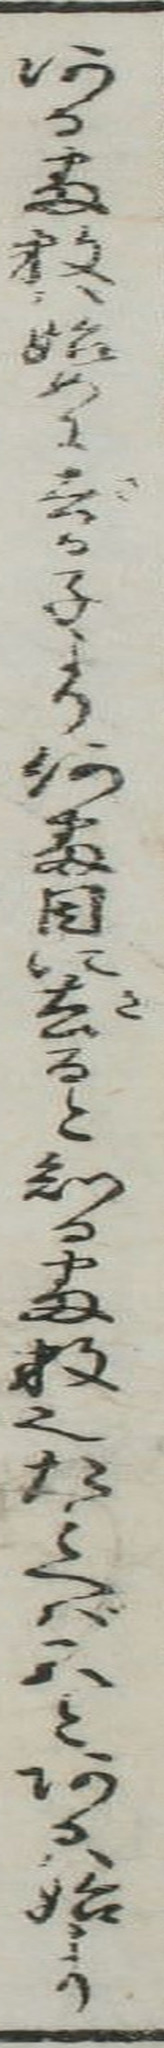ある番数は始めに去る子より何番目に去ると知る番数也たとへば五とあるは始より
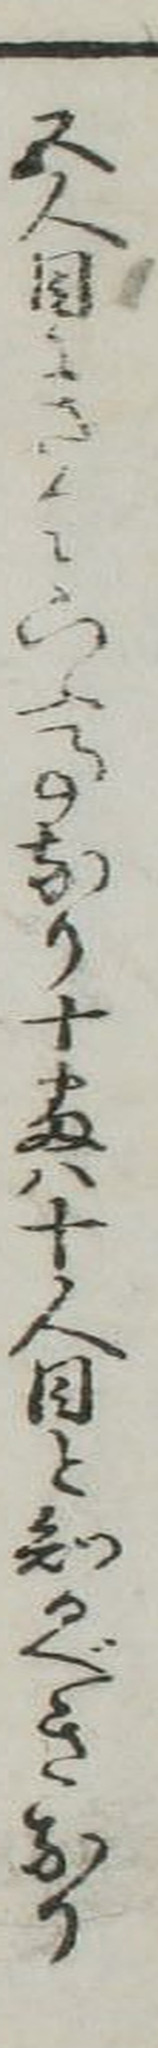五人目にさるといふ事なり十番は十人目と知るべきなり
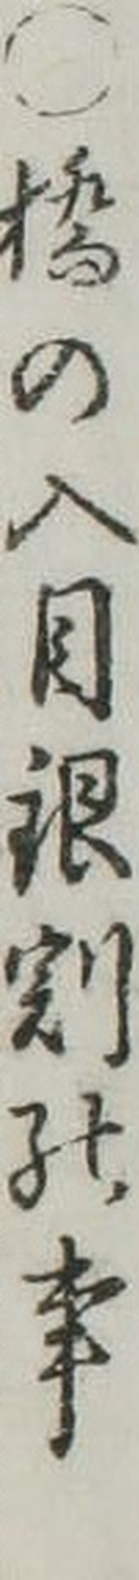○橋の入目銀割の事
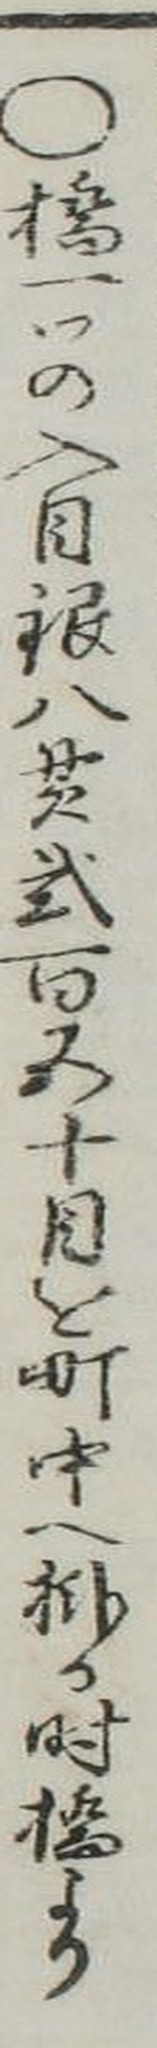○橋一ツの入目銀八貫弐百五十目を町中へ掛る時橋より
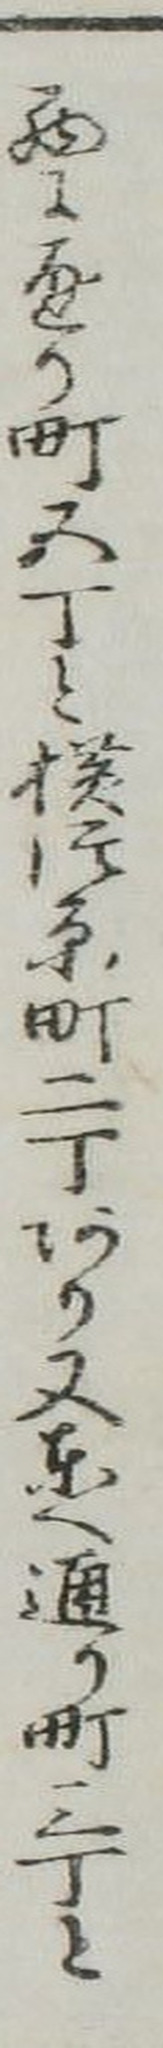西に通り町五丁と横片原町二丁あり又東へ通り町三丁と
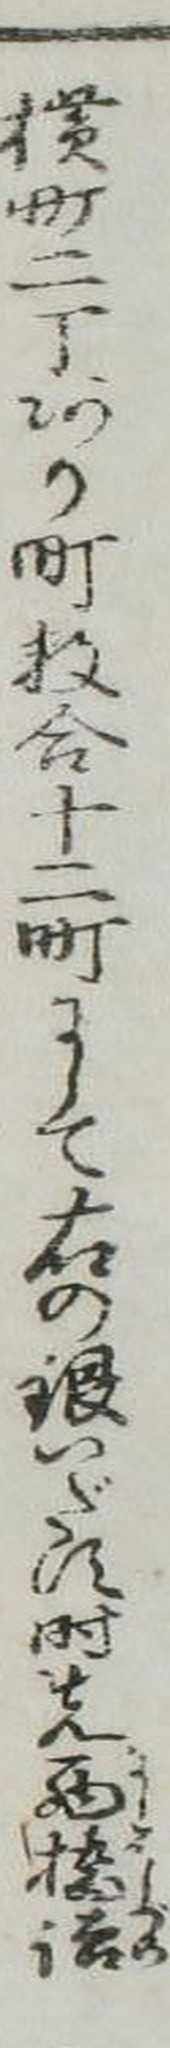横町二丁あり町数合十二町にして右の銀いだす時先西橋詰
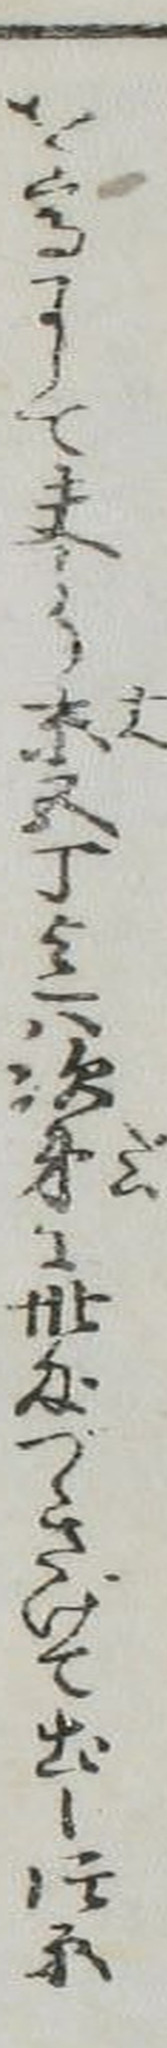を高にして夫より末五丁迄は次第に卅匁づゝさげて出し片原
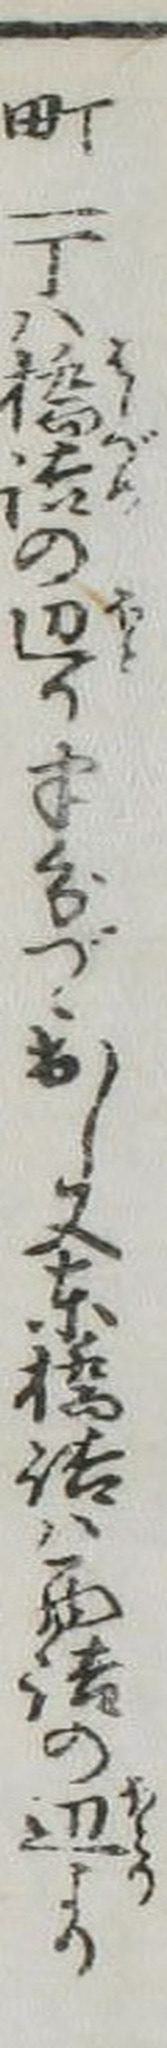町一丁は橋詰の返り半分づゝ出し又東橋詰は西詰の返より
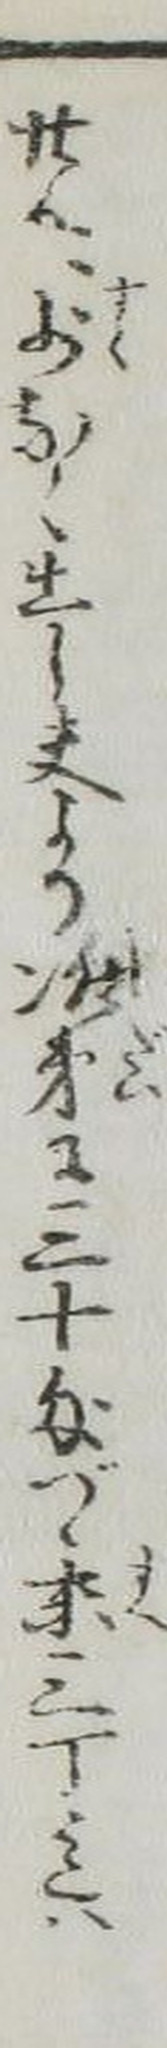廿匁少なく出し夫より次第に三十匁づゝ末三丁迄は
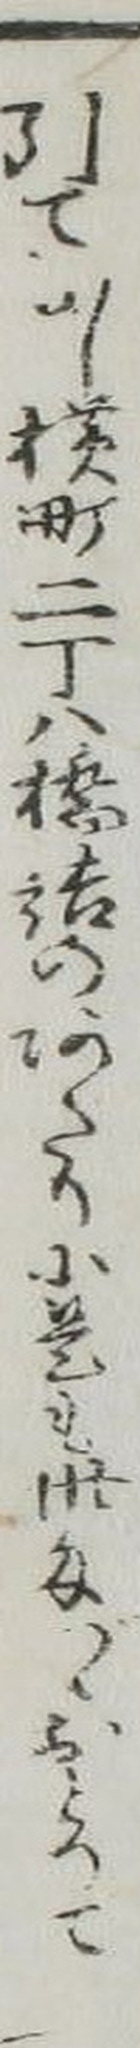引て出し横町二丁は橋詰のあたりに是も卅匁づゝおとりて
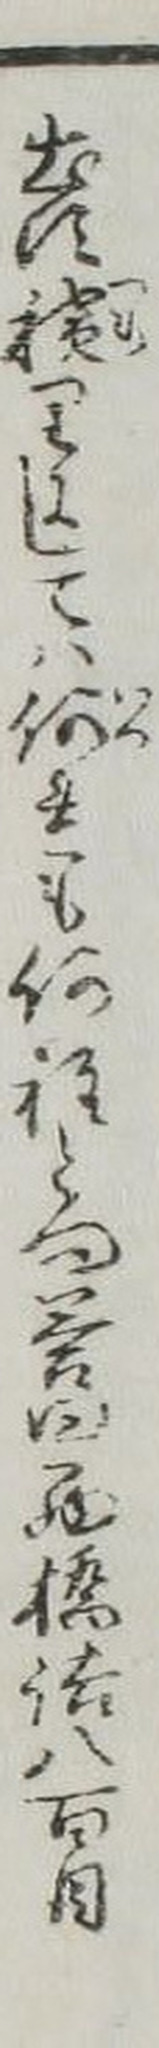出す積りにしては何れも何程と問答曰西橋詰八百目
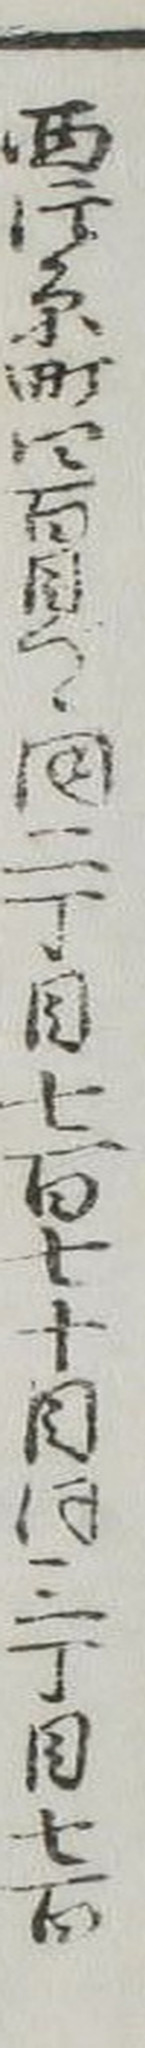西片原町四百目づゝ同二丁目七百七十目同三丁目七百
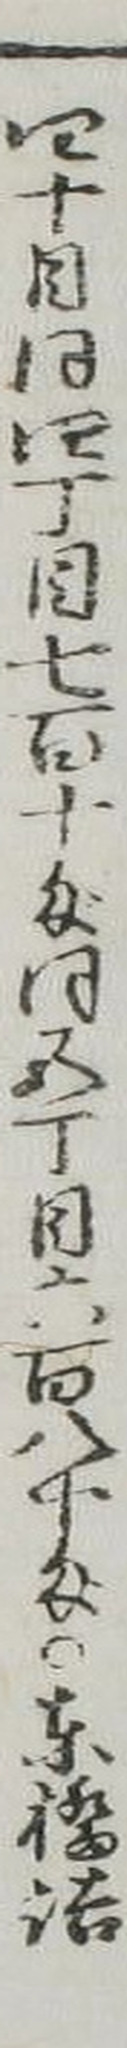四十目同四丁目七百十匁同五丁目六百八十匁◦東橋詰
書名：宝玉塵劫記
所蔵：東京学芸大学教育コンテンツアーカイブ
